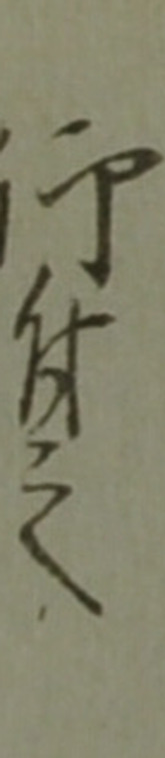仰付之
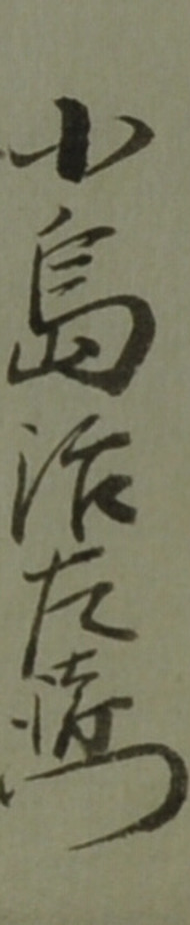小島治左衛門
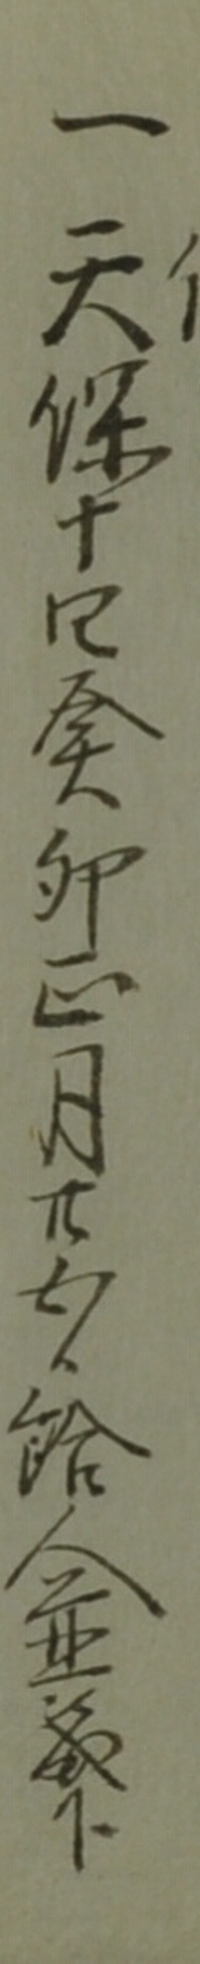一天保十四癸卯正月廿五日給人並被成下
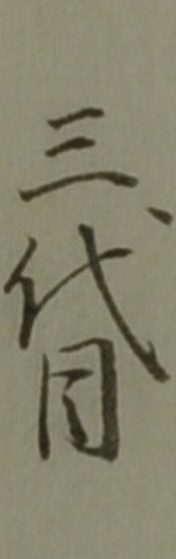三代目
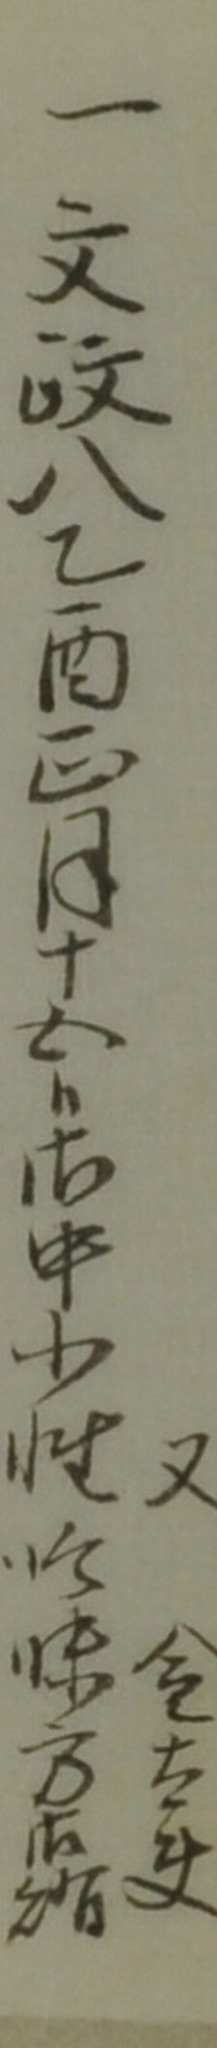一文政八乙酉正月十五日御中小姓吟味方御賄
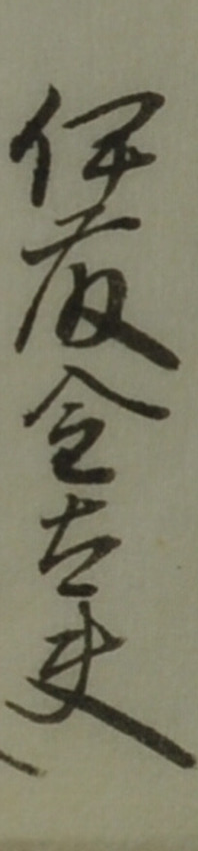伊藤金太夫
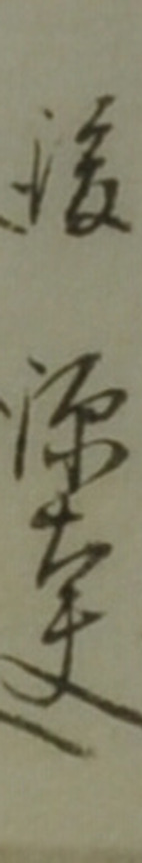後源太夫
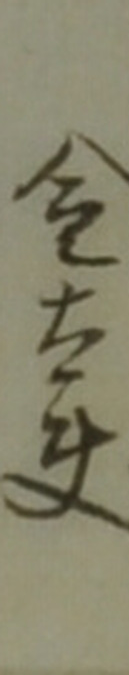又金太夫
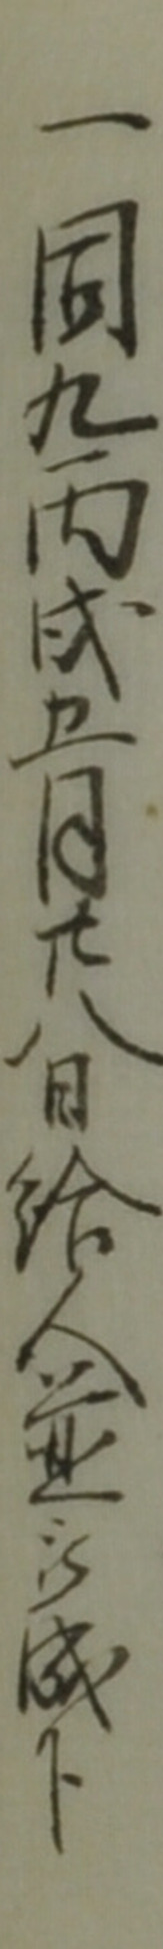一同九丙戌五月廿八日給人並被成下
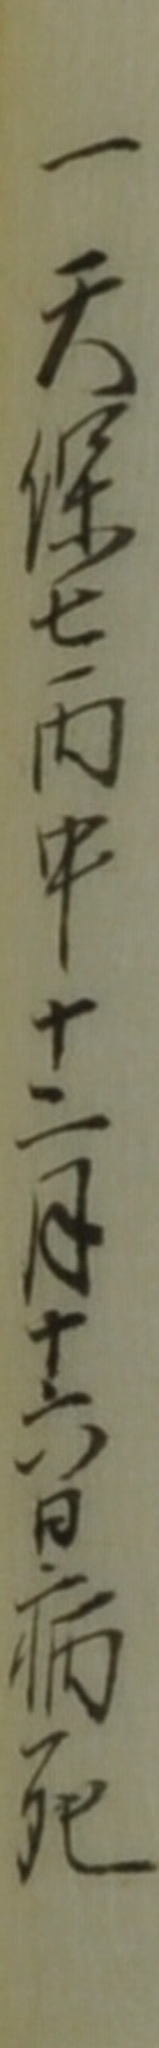一天保七丙申十二月十六日病死
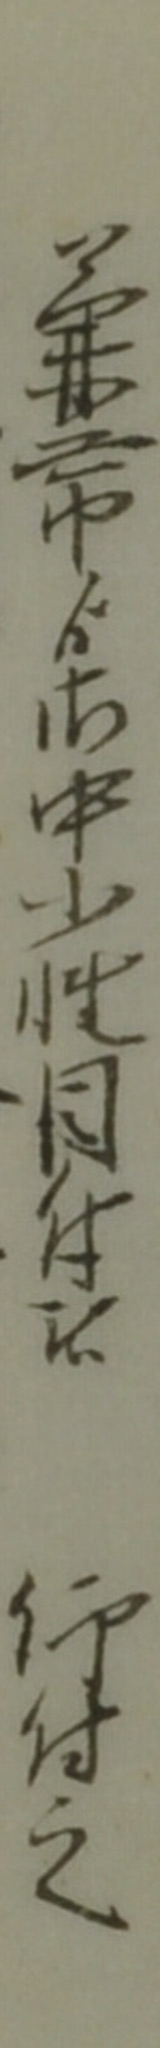兼帯より御中小姓目付被仰付之
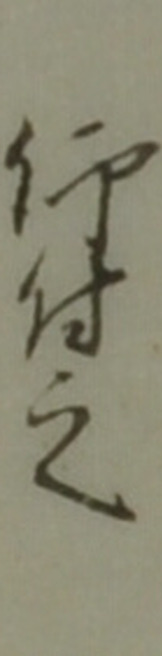仰付之
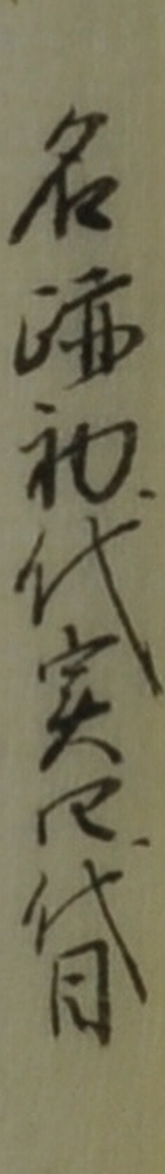名跡初代実四代目
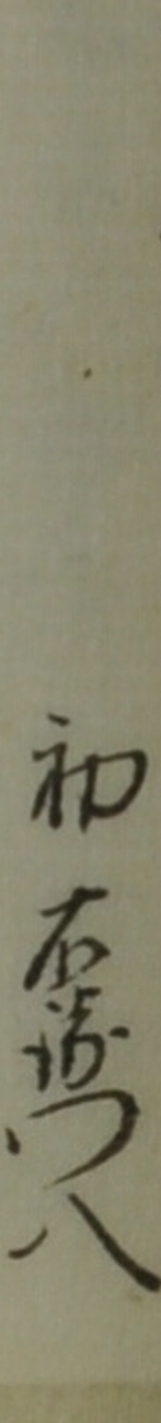初右衛門八
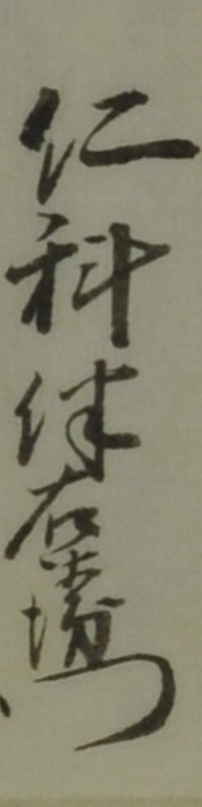仁科伴右衛門
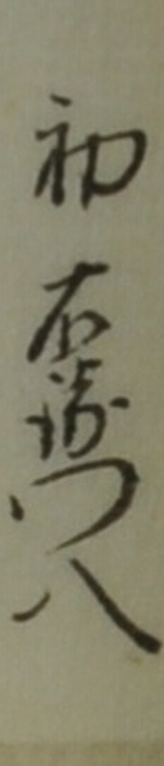初右衛門八
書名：諸御役代々録（八）
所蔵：伊那市立高遠町図書館・合同会社AMANE
